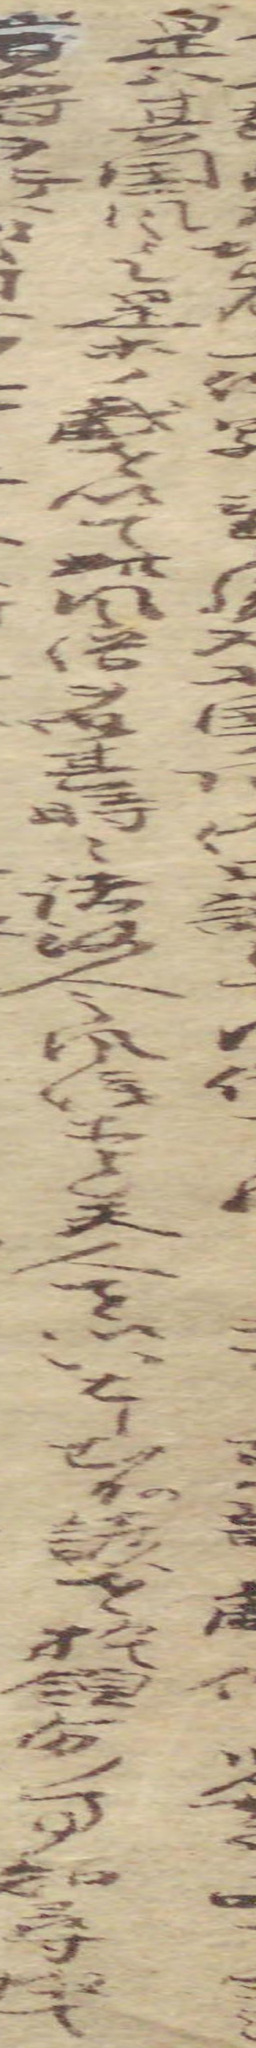是ハ其国風ニて是等ノ戯を以て此風俗ヲ御其時々諸役人之風儀等迄天人を以いはしむるの諺を捨領分ノ方知尋拠て
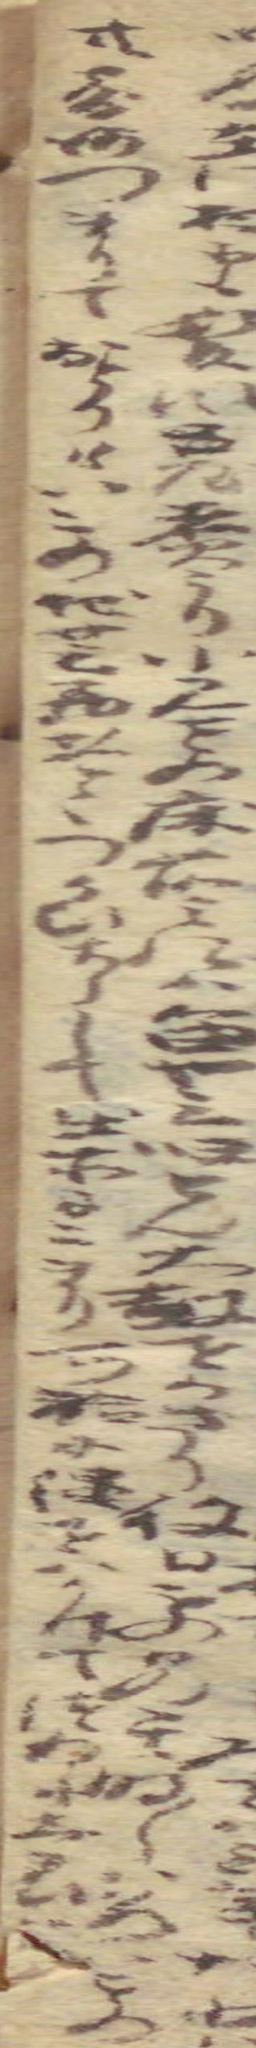共寄あつまりておとりけいこの地芝居なとゝつかひちらして出所にこまり一ツ袷に縄をハかけてつゐにしまいハ
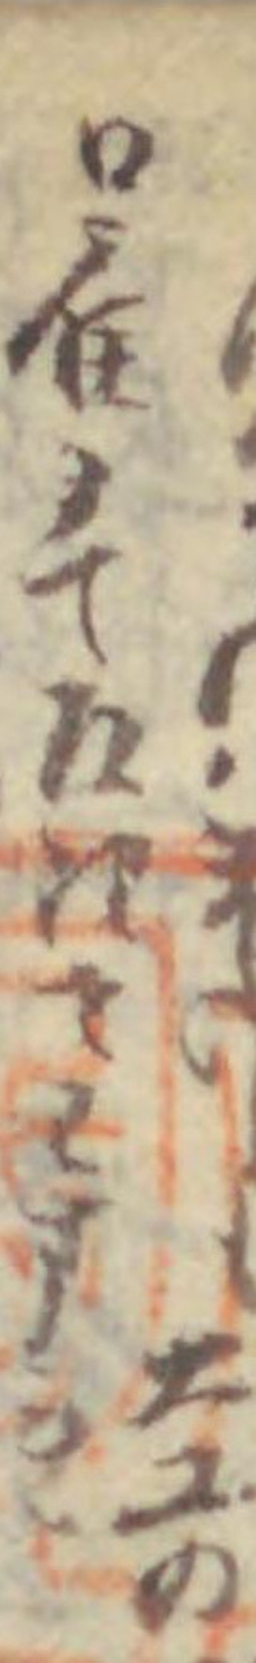日雇まて道理をわすれ
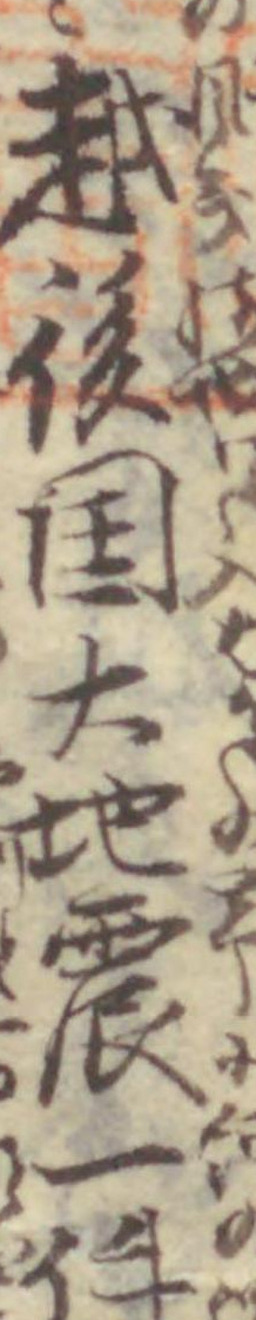越後国大地震一件
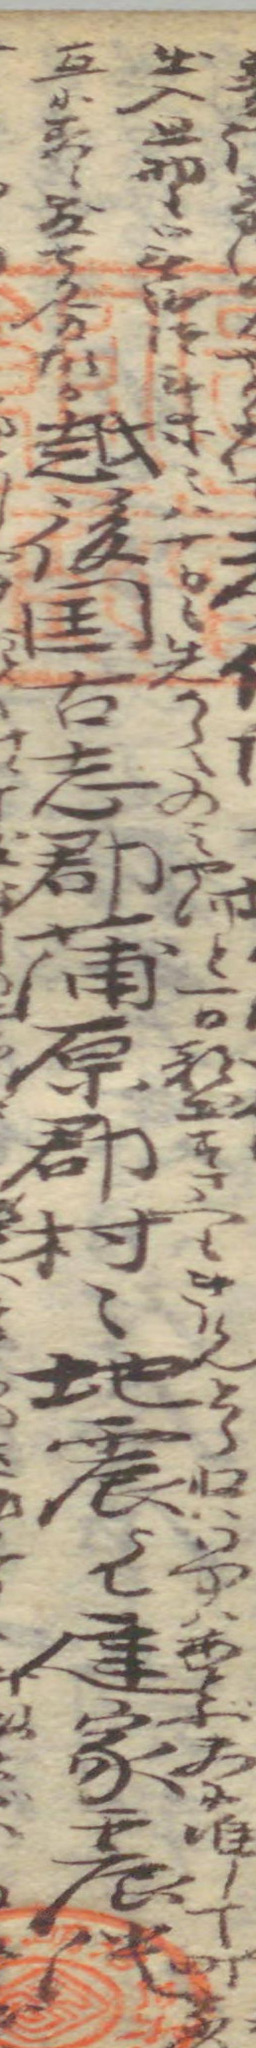越後国古志郡蒲原郡村〻地震ニて建家震潰
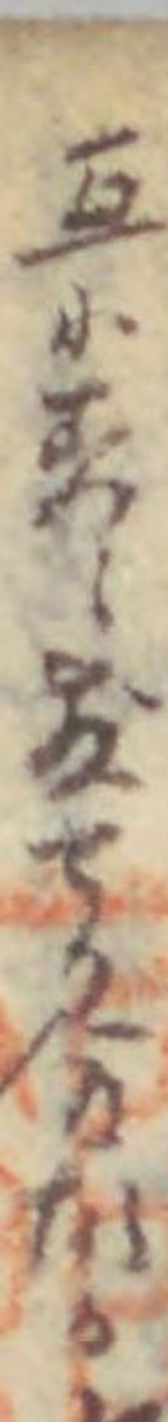互に美々敷せり合故か
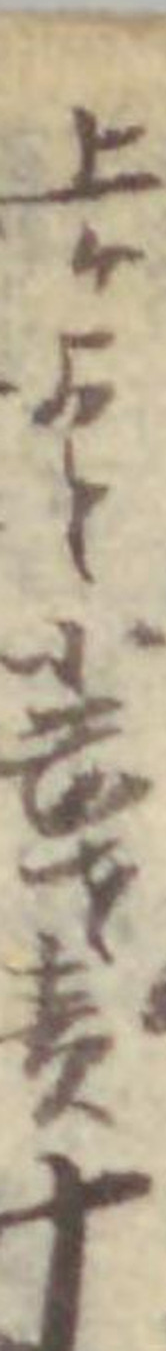上ケよと小前を責
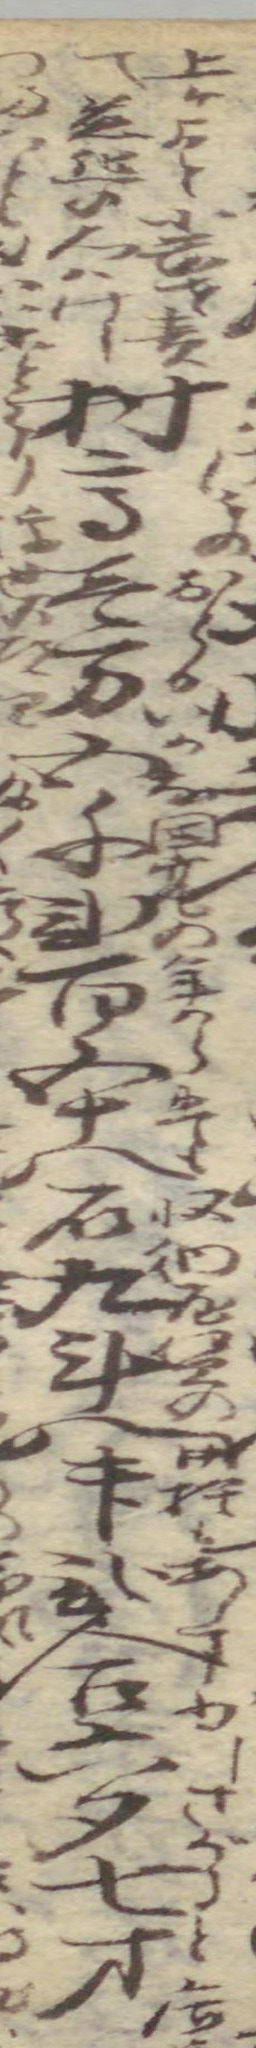村高壱万五千弐百五十八石九斗八升弐合六勺七才
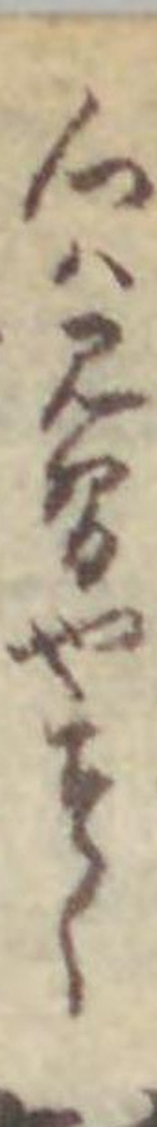心ハ見習やすく
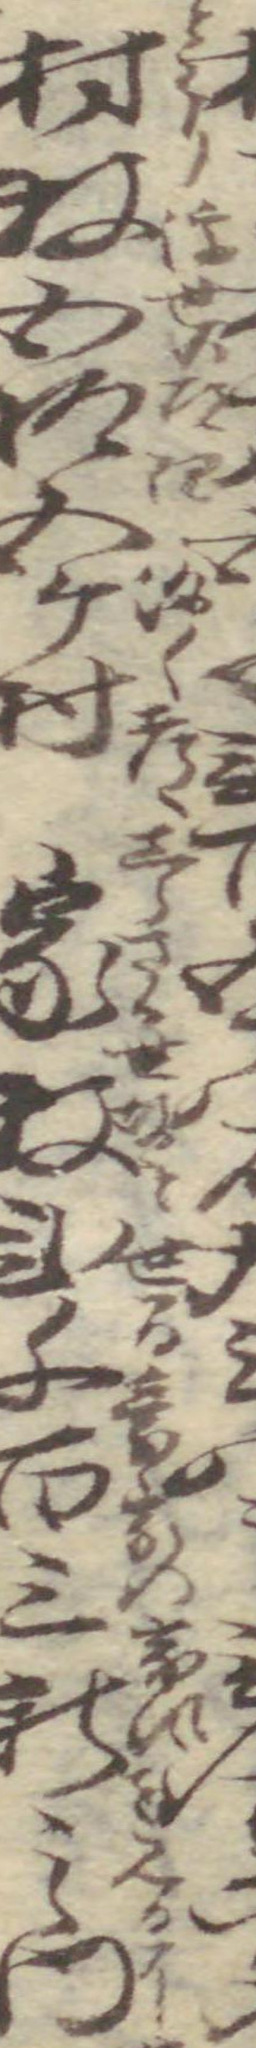村数五拾五ケ村家数弐千百三軒之内
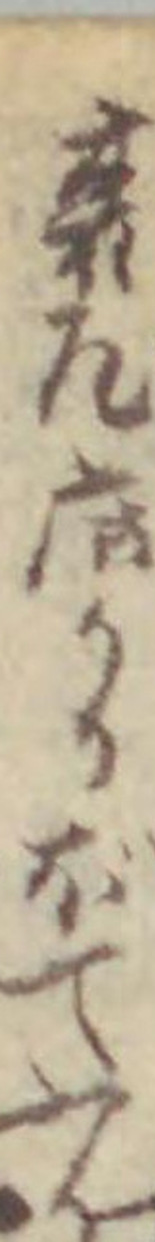裏屋店かりぼてふり
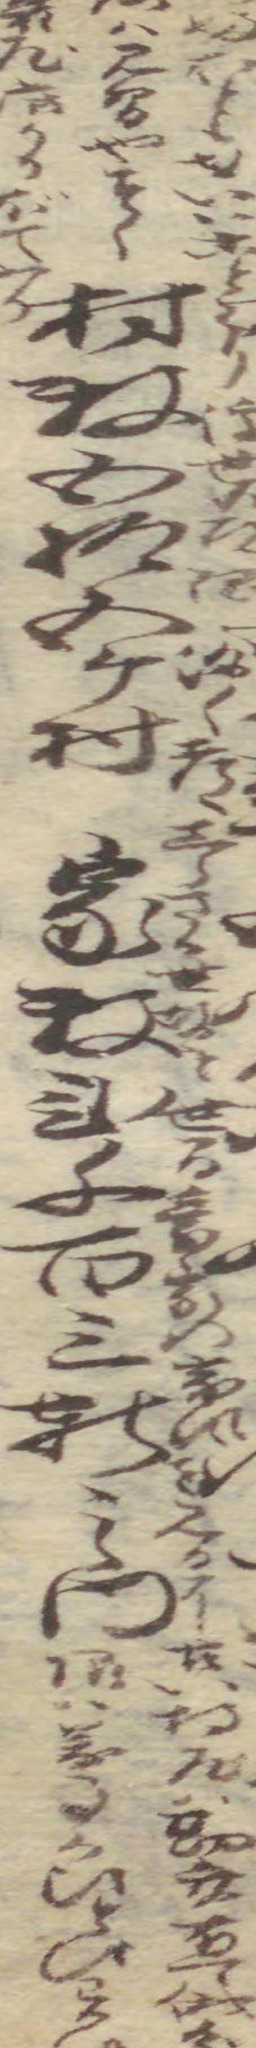村数五拾五ケ村家数弐千百三軒之内
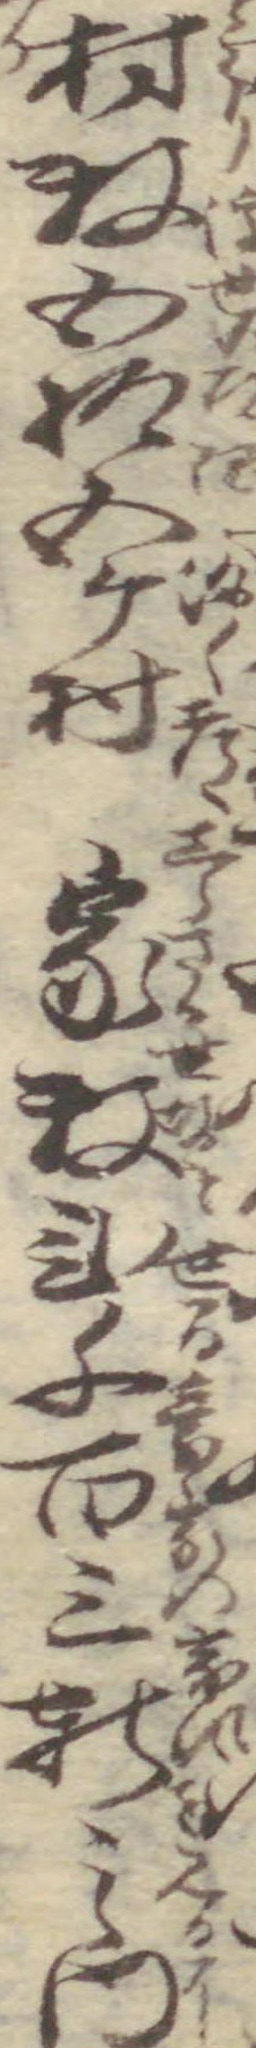村数五拾五ケ村家数弐千百三軒之内
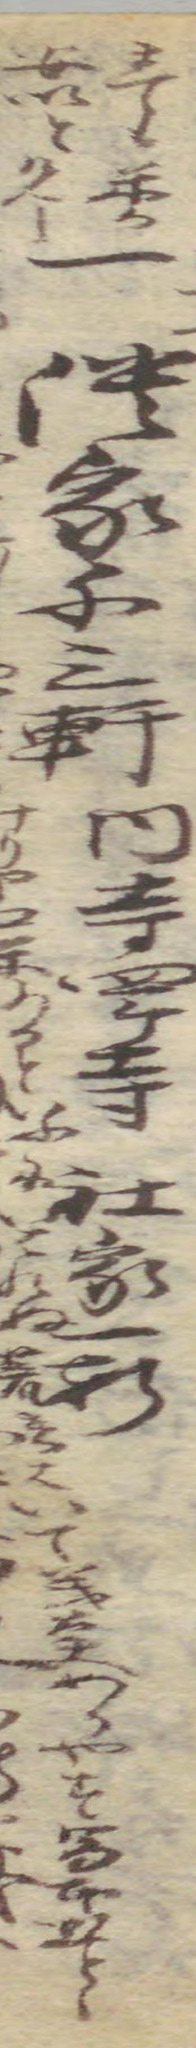一潰家千三軒内寺四ケ寺社家一軒
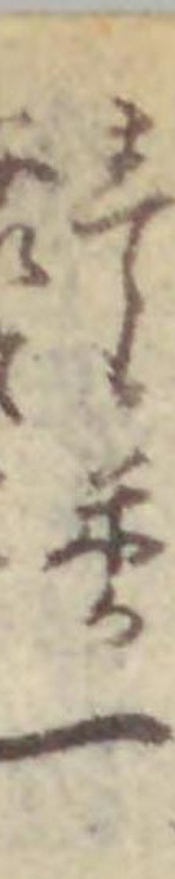まても米か
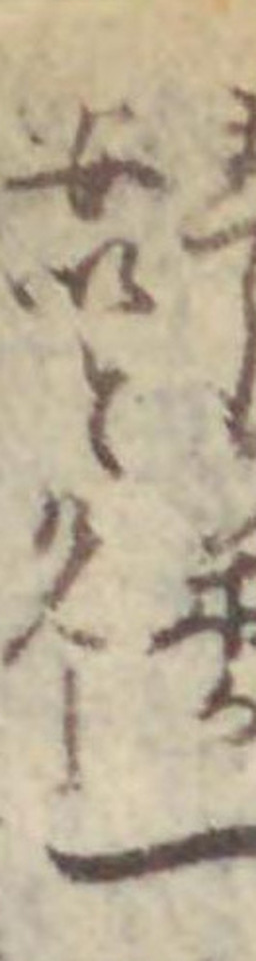安いとけんし
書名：鶯宿雑記. 巻199-200
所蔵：国立国会図書館 National Diet Library, JAPAN
